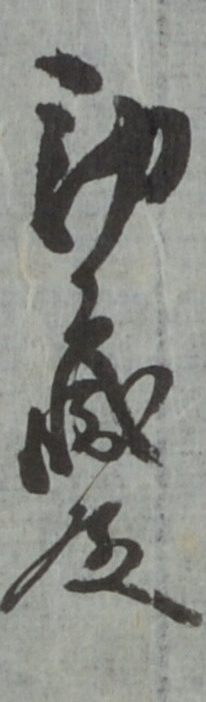勘蔵殿

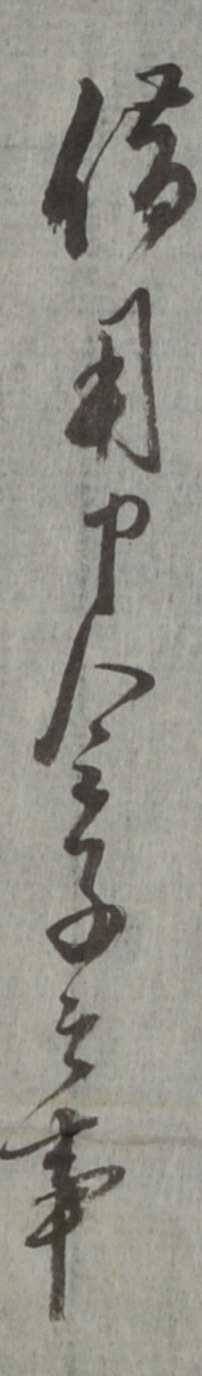借用申金子之事
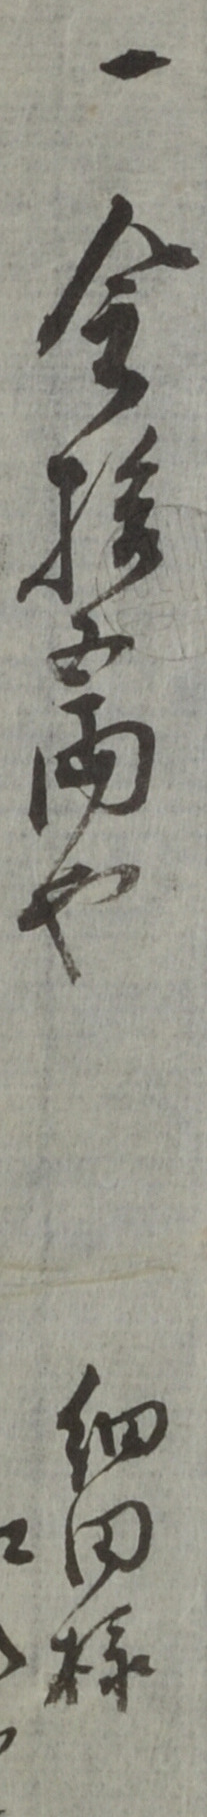一金拾五両也細田様
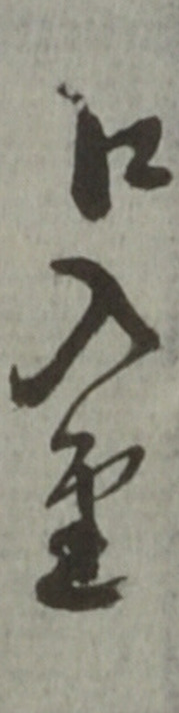口入金
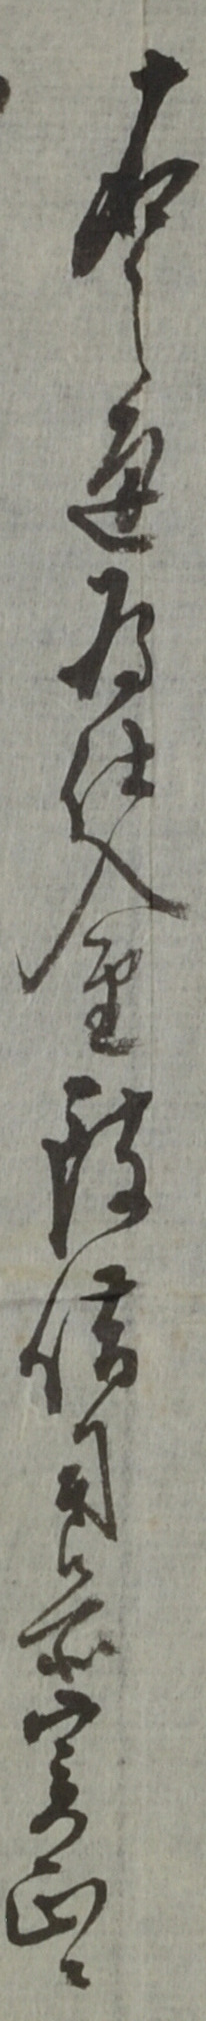右之通為仕入金致借用候所実正ニ
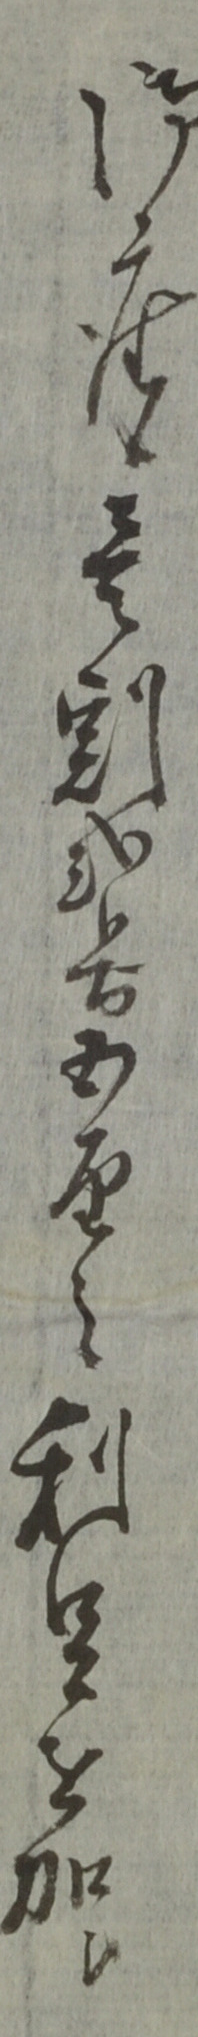御座候壱割弐分五厘之利足を加江
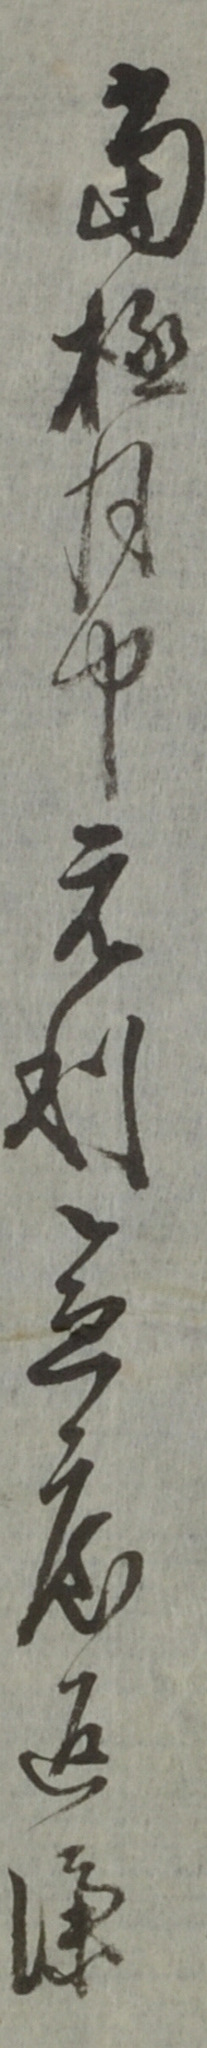当極月中元利急度御返済
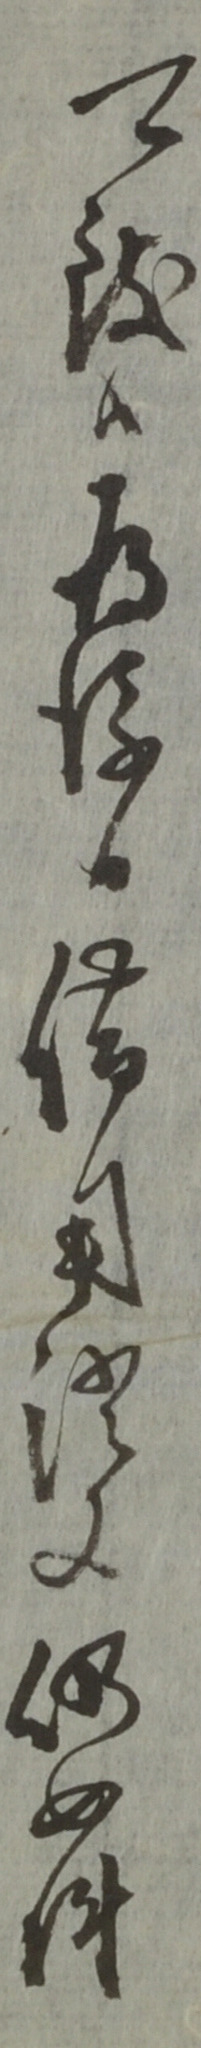可致候為後日借用証文仍如件
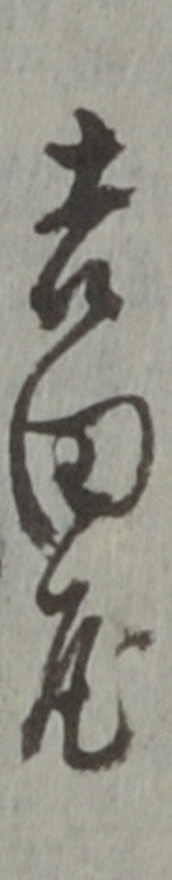吉田屋
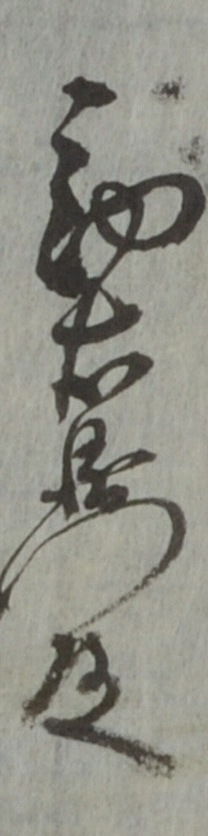勘右衛門殿
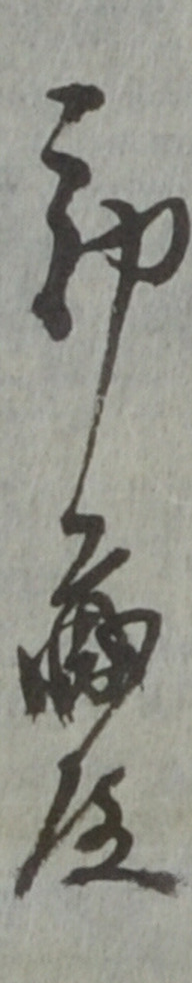勘蔵殿

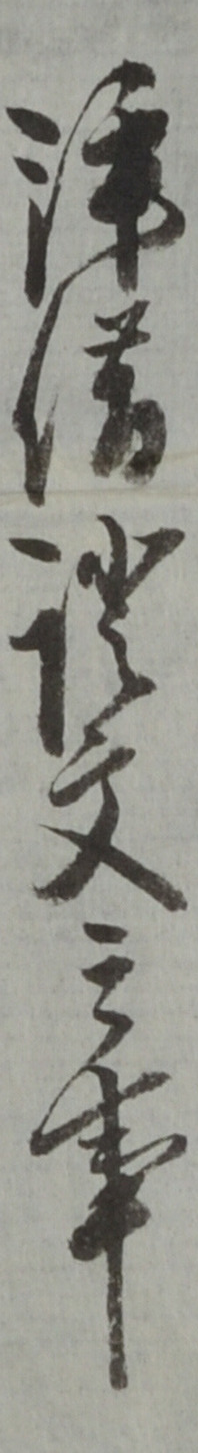拝借証文之事
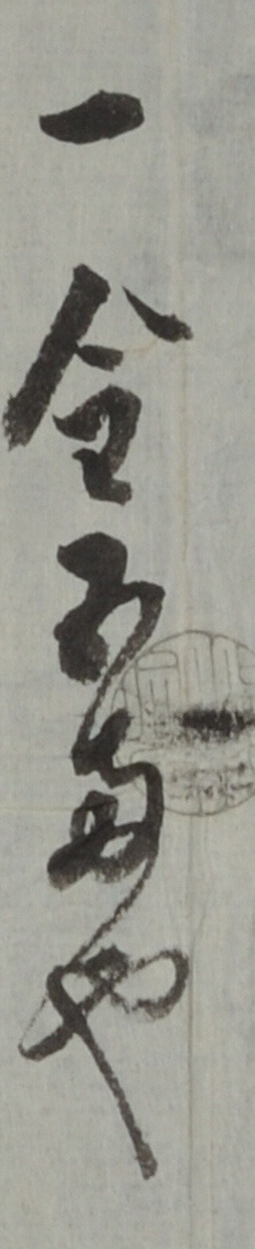一金五両也
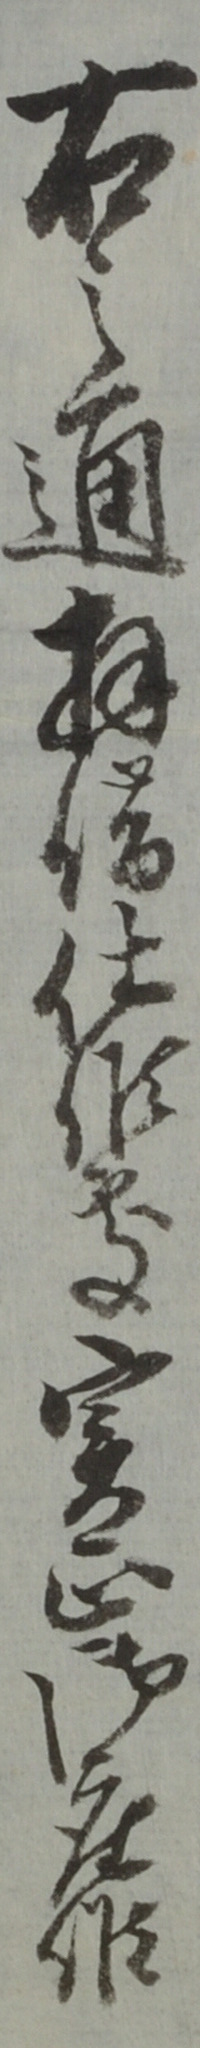右之通拝借仕候処実正御座候
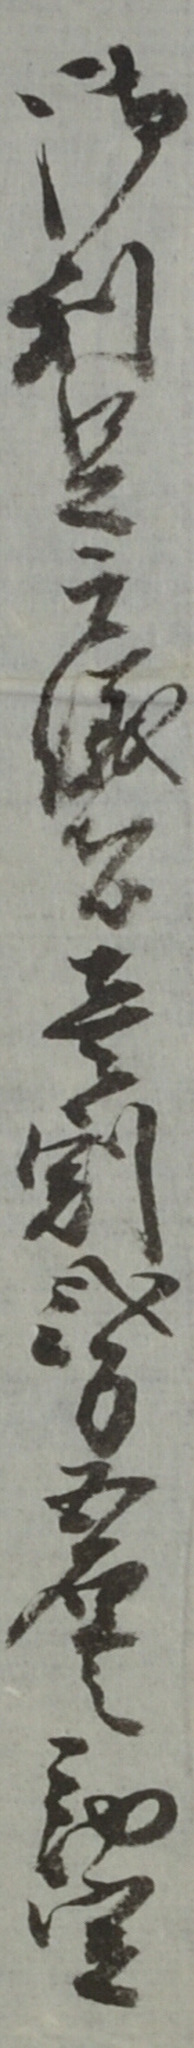御利足之儀は壱割弐分五厘之勘定
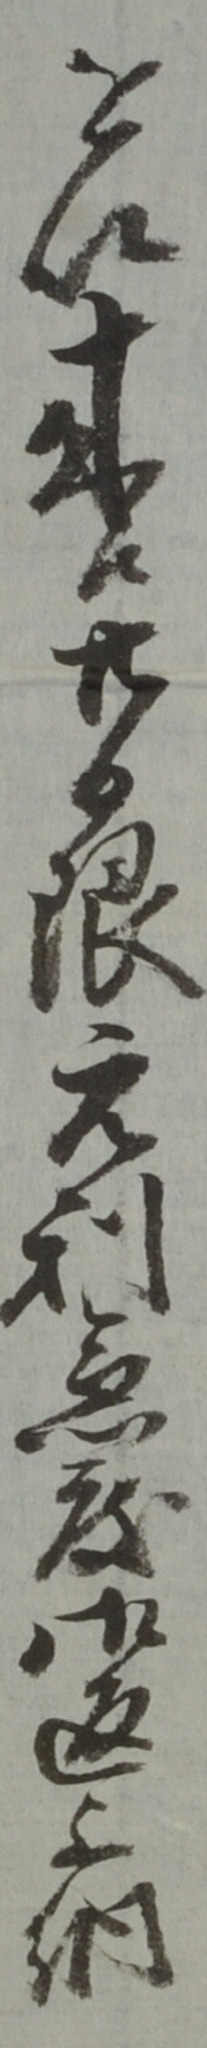を以来ル廿日限元利急度御返上納
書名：拝借證文之事
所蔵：伊那市立高遠町図書館・合同会社AMANE
